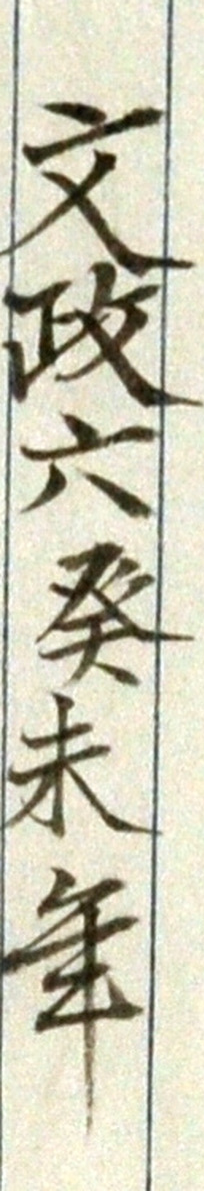文政六癸未年
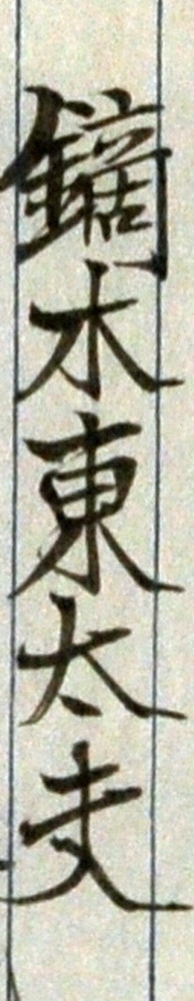鏑木東太夫
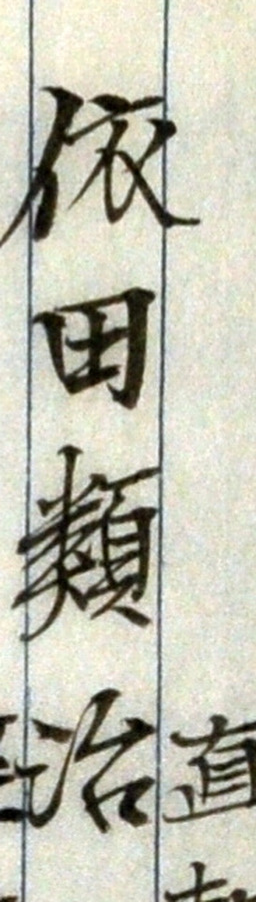依田類治
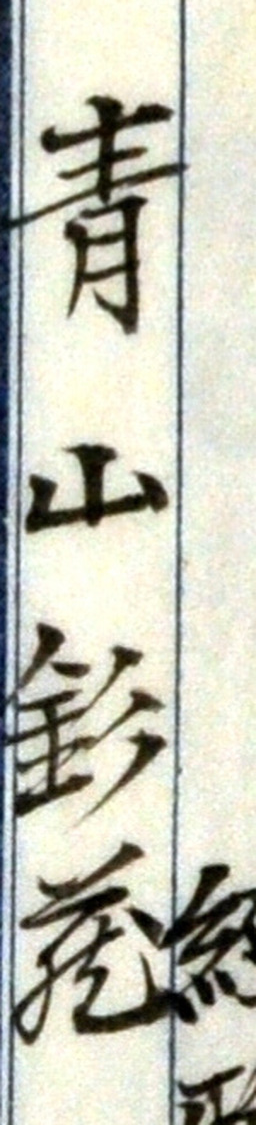青山釤蔵
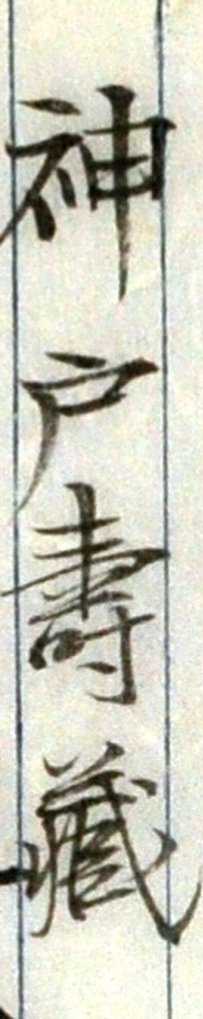神戸寿蔵
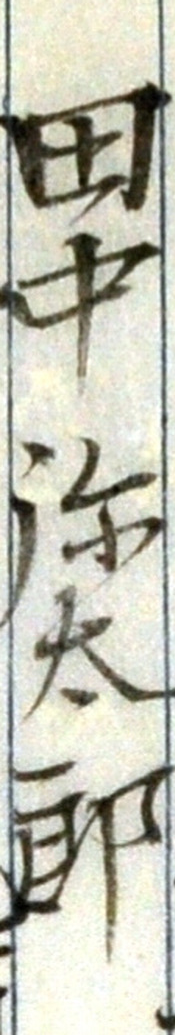田中弥太郎
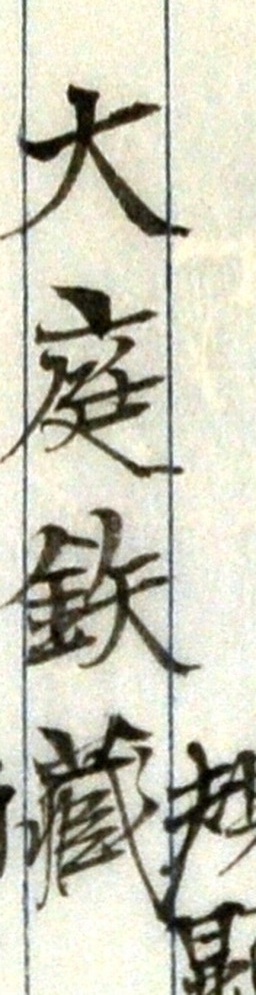大庭鉄蔵
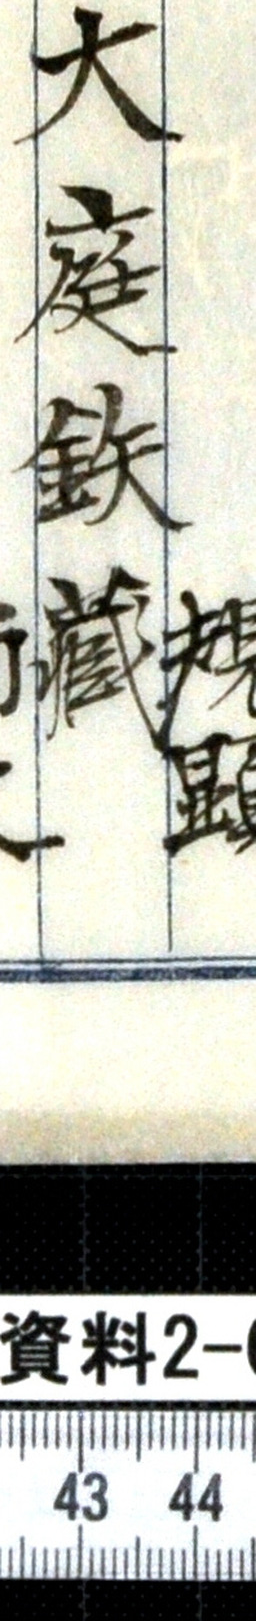大庭鉄蔵
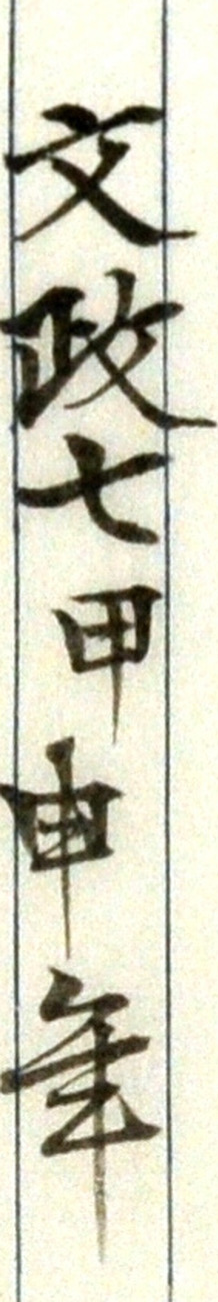文政七甲申年
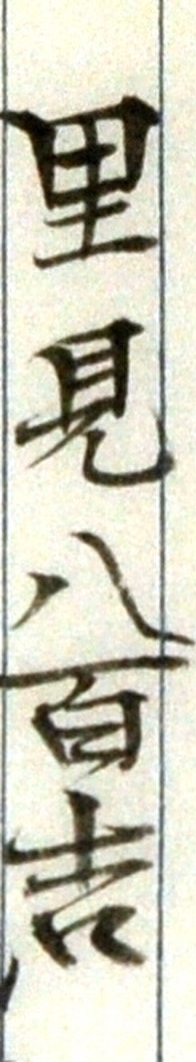里見八百吉

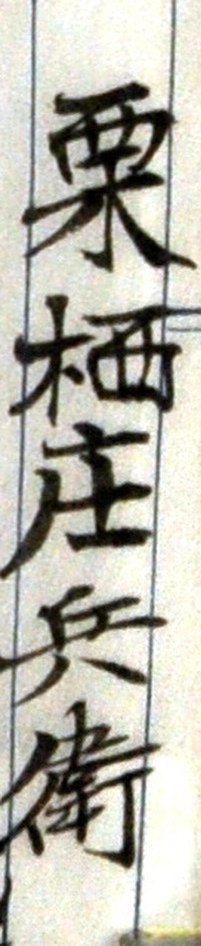栗栖庄兵衛
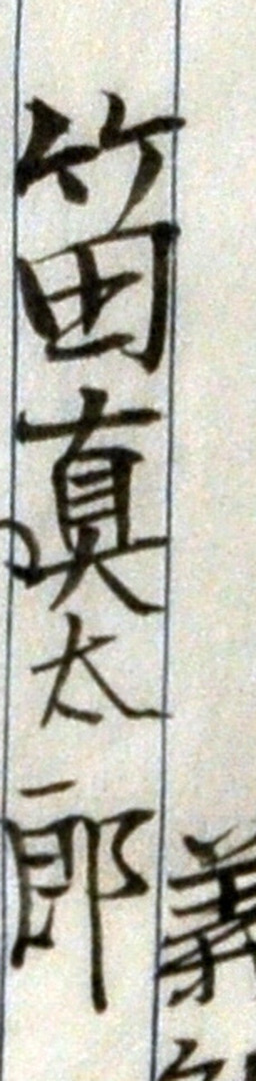竹田真太郎
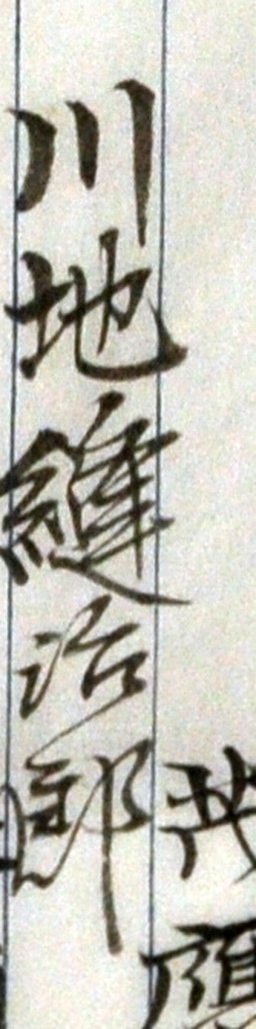川地縫治郎
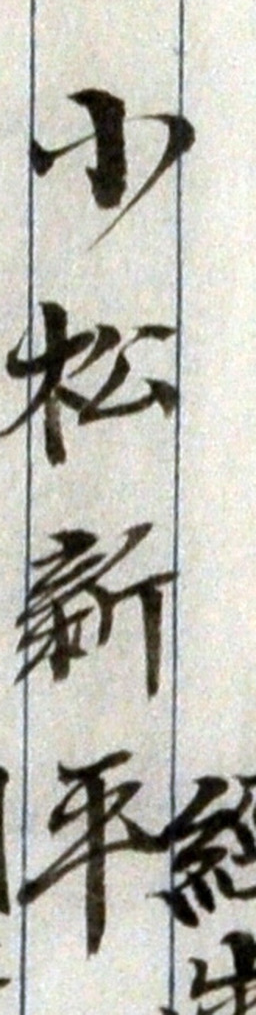小松新平
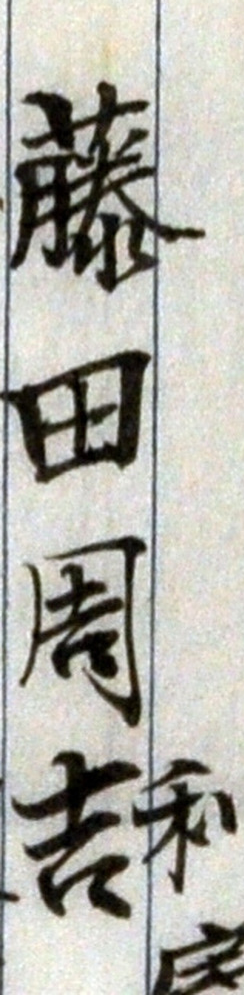藤田周吉
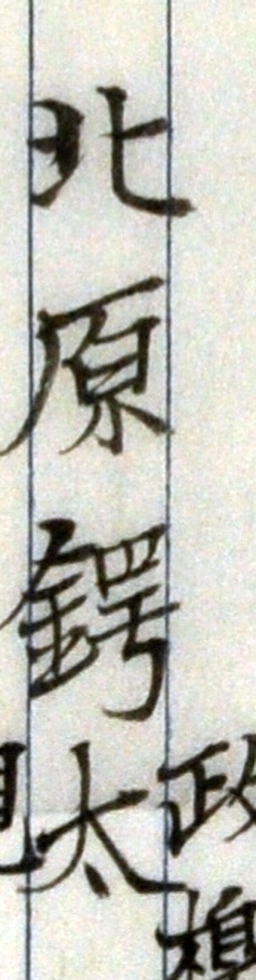北原鍔太
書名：竹内流・甲州流・荒木流・一刀流新当流起請文及免許写堤宝山流手鏡及個之大事
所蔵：伊那市立高遠町図書館・合同会社AMANE
